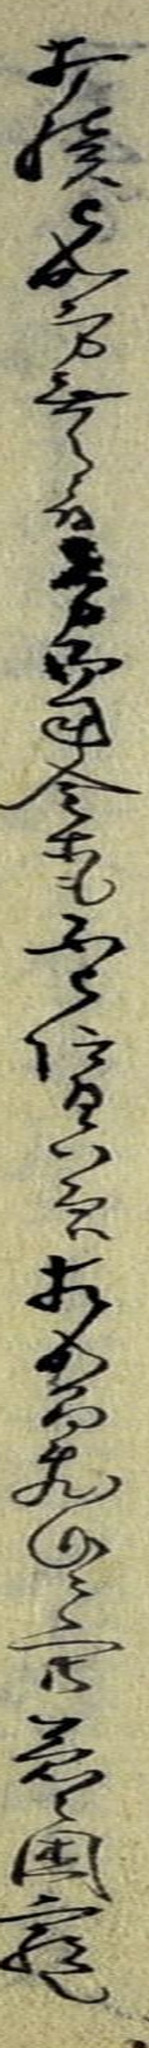打続被成方無之に付旁御用金等も不被仰付候い而は相成間敷趣に候へ共兼々困窮之
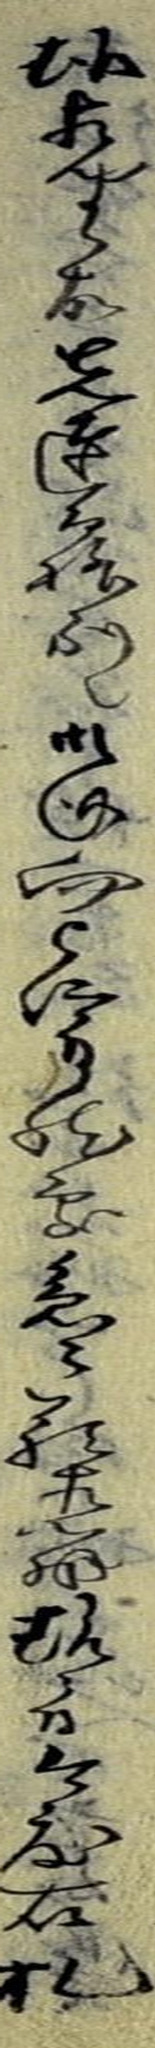趣相聞候故先達而各別之御趣向被仰付然処急々難相弁趣に付今度右札
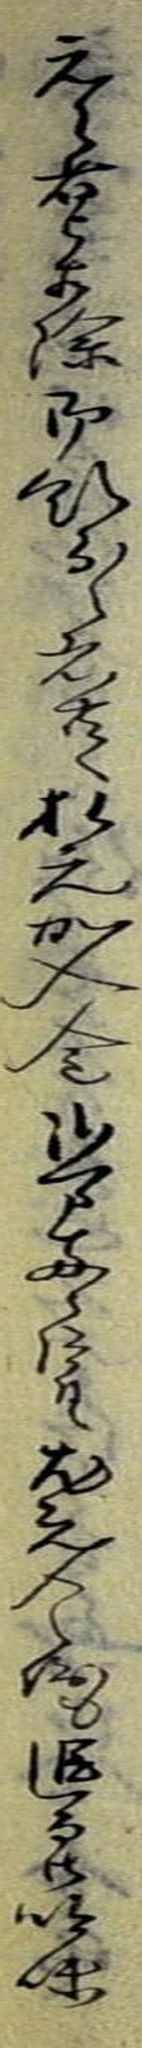元之者被相除御領分之者共へ札元加入金弐万両被仰付候尤元〆之儀も追而御吟味
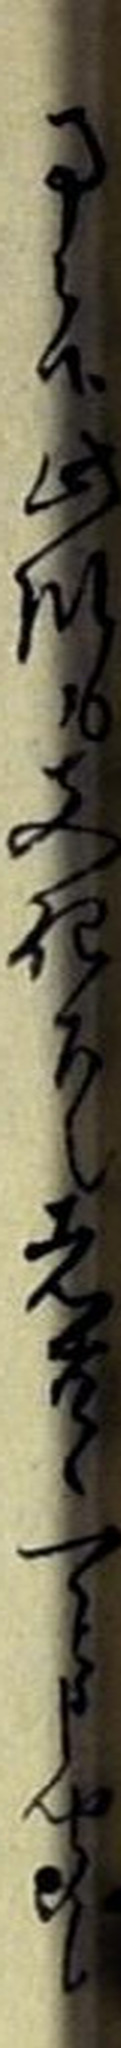事に候此段も支配下之者共へ可被申聞候
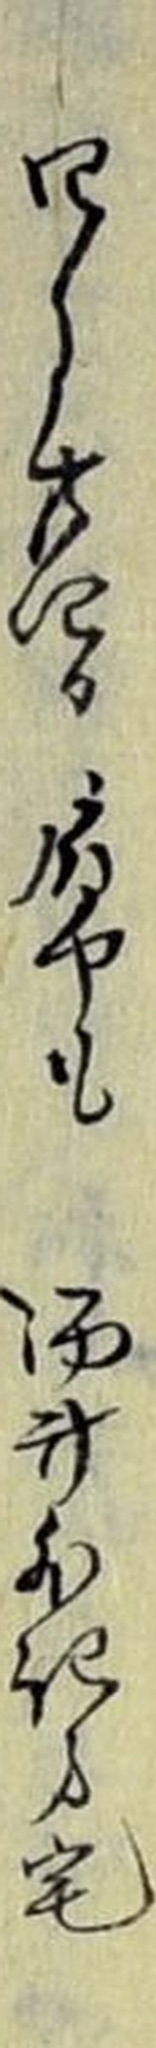四月廿四日府中も酒井外記方宅
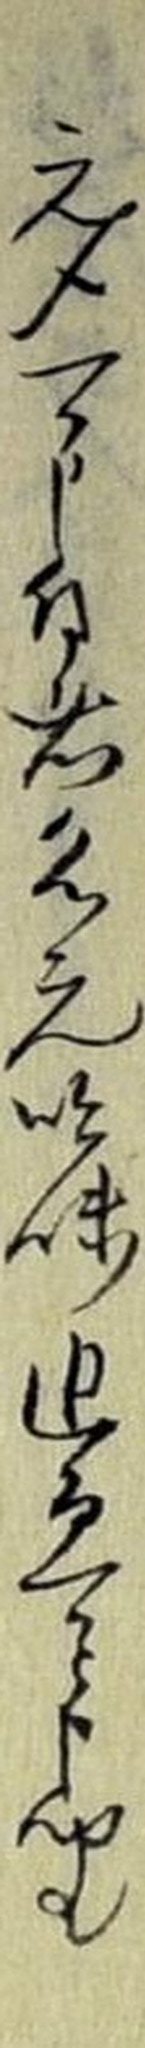元〆可申付者名元吟味追而可被申聞候
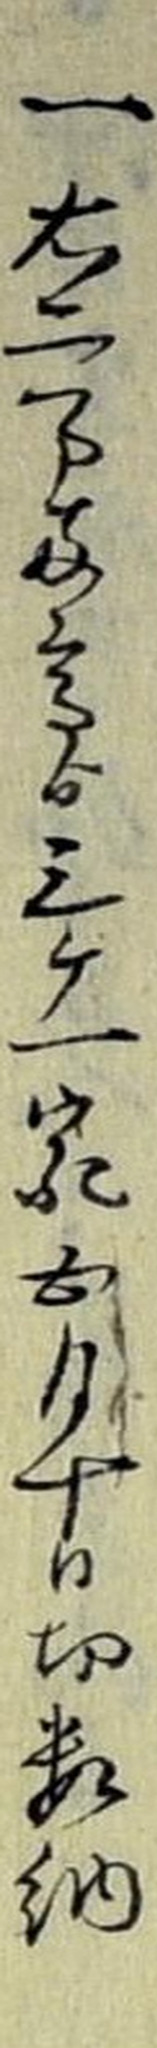一右二万両高ゟ三ヶ一宛五月十日切数納
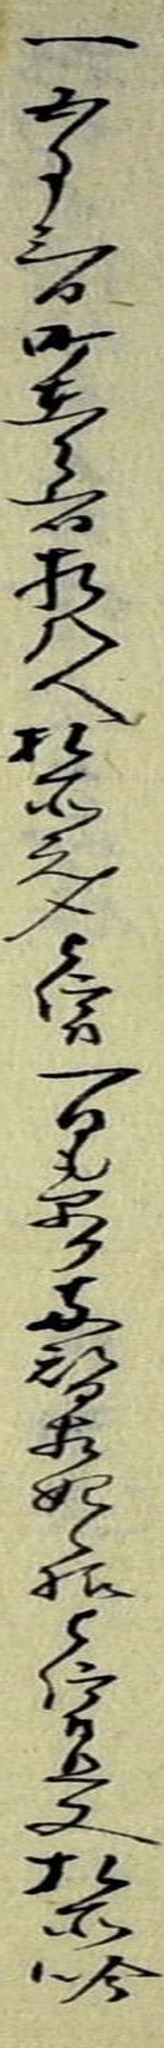一五月三日町在之者拾八人札所元〆被仰付一日も早く両替相始候様被仰付且又札所吟
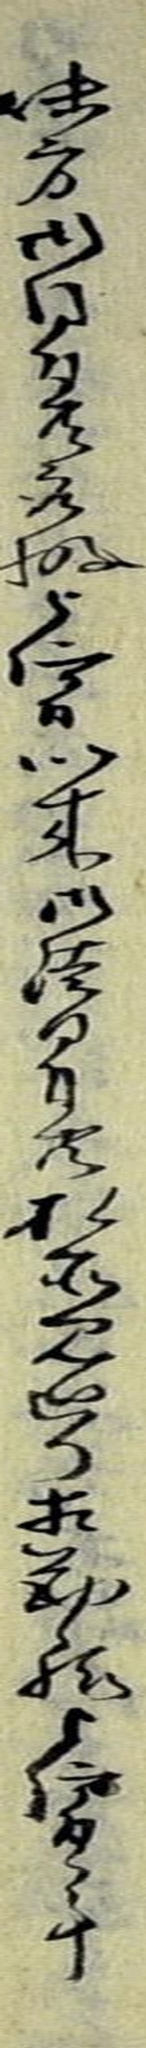味方御目付共取扱被仰付以来御徒目付共札所見廻り相勤候様被仰付候事
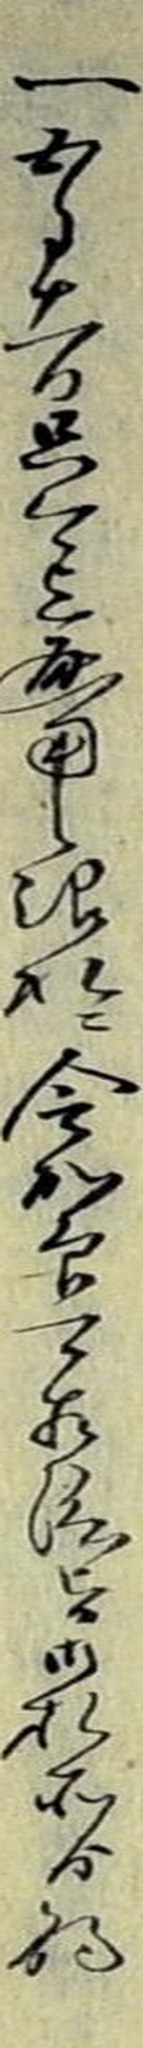一五月十一日只今迄通用候銀札に令加印可相渡旨御札所ゟ触
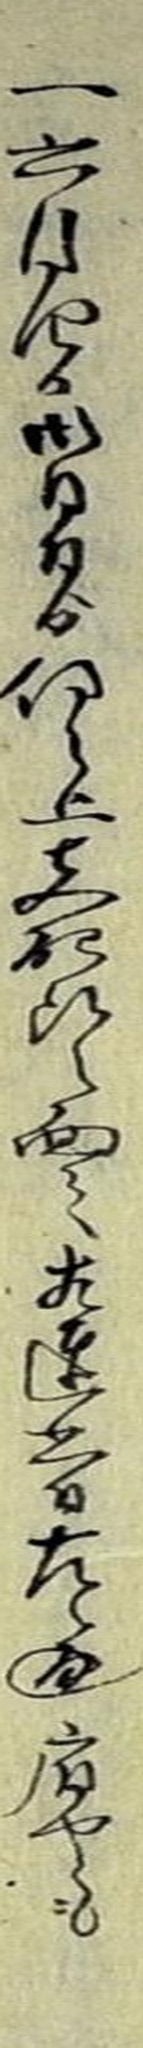一六月四日御目付ゟ伺之上支配頭之面々へ相達書付左之通府中へも
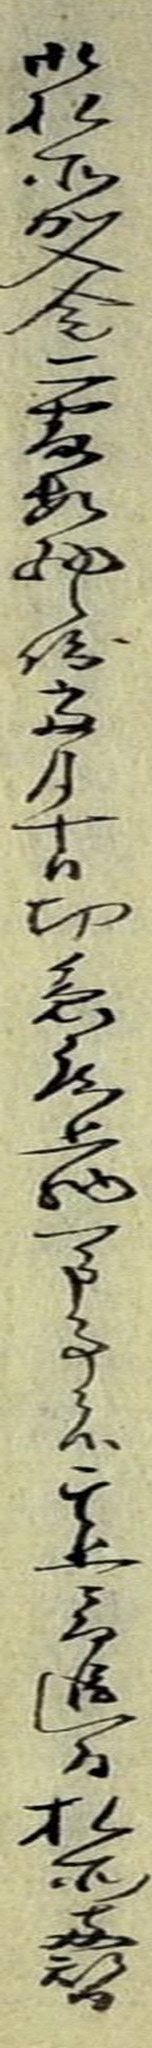御札所加入金二番数納之儀当月十日切急度上納可申事に候其上に而追而札所両替
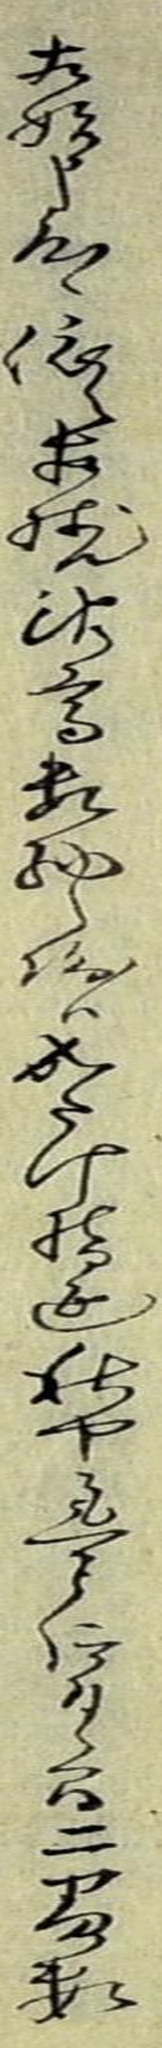相始申度候依之相残る銀高数納之儀は成たけ指延秋中にも可被仰付候間二番数
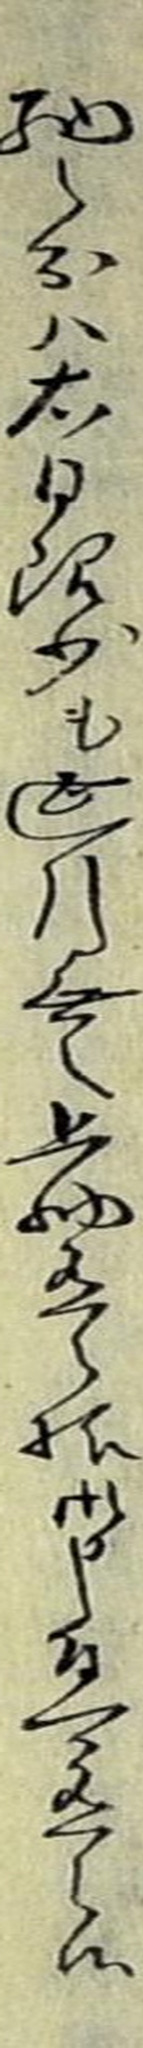納之分は右日限少も延引無之上納有之様御申付可有之候
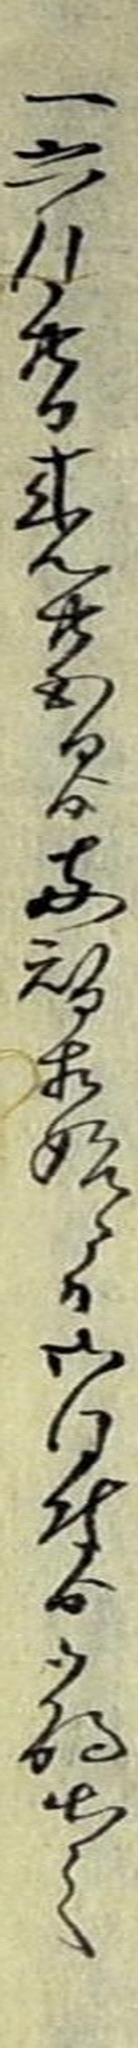一六月廿日来る廿五日ゟ両替相始候に付御目付ゟ御触出之
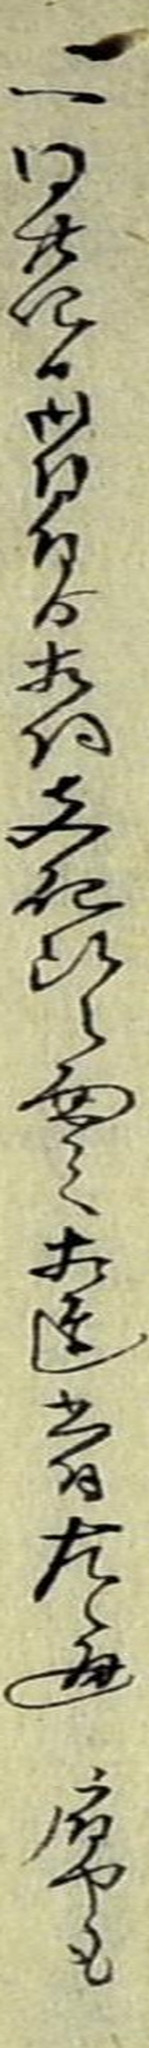一同廿四日御目付ゟ相伺支配頭之面々へ相達書付左之通府中へも
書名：命令之部 二
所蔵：福井県文書館 Fukui Prefectural Archives
